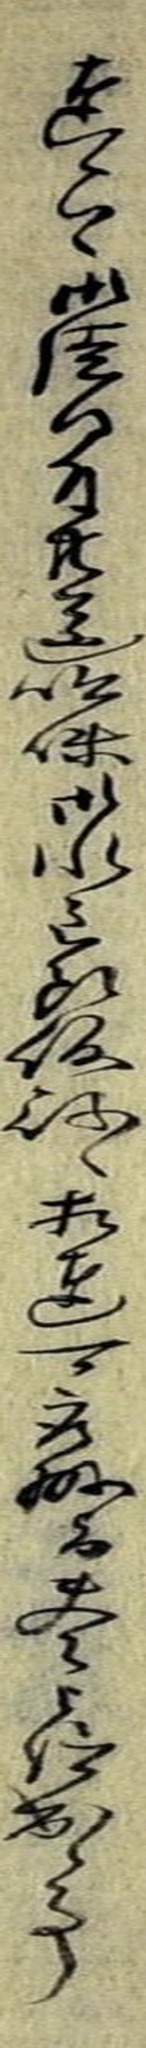達候ハヽ御徒目付共遂吟味御水主頭仮役へ相達可取扱旨夫々被仰出候事
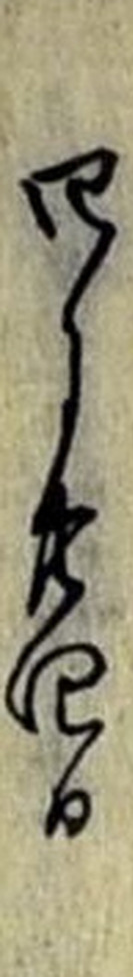四月廿四日
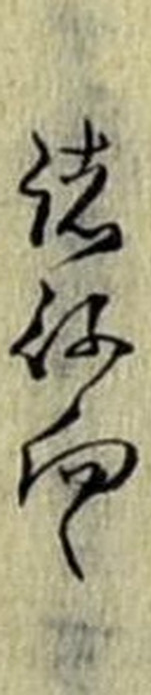諸役向へ
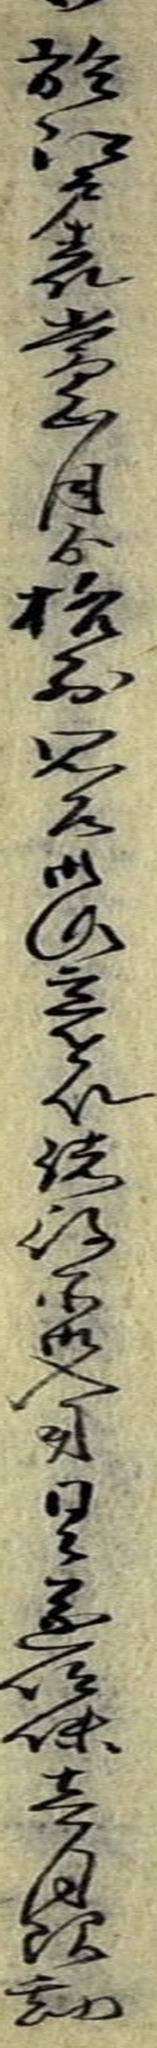〇於江戸表当正月ゟ格別思召御趣意を以諸役所御入用遂吟味壱月限勘
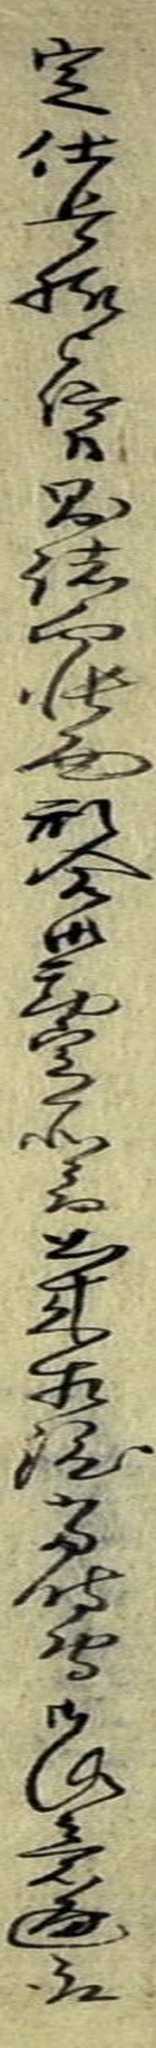定仕上候様被仰付則諸向帳面形合御勘定所ニ而出来相渡当時専御趣意通取
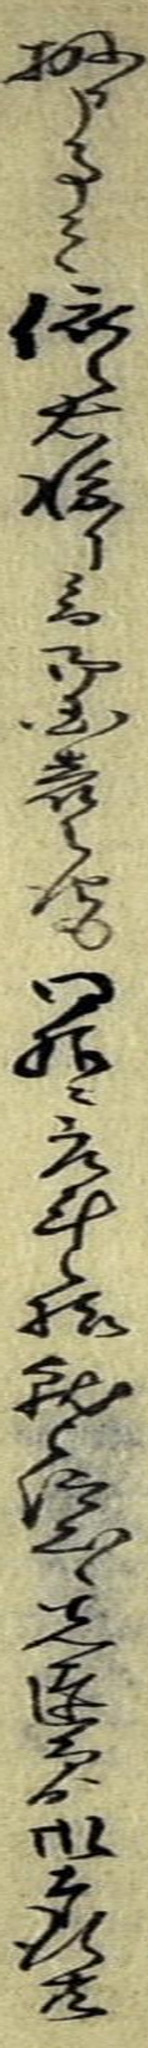扱申事ニ候依之右移りニ而御国表之儀も同様ニ取計候様就被仰出候先達而ゟ御奉行共
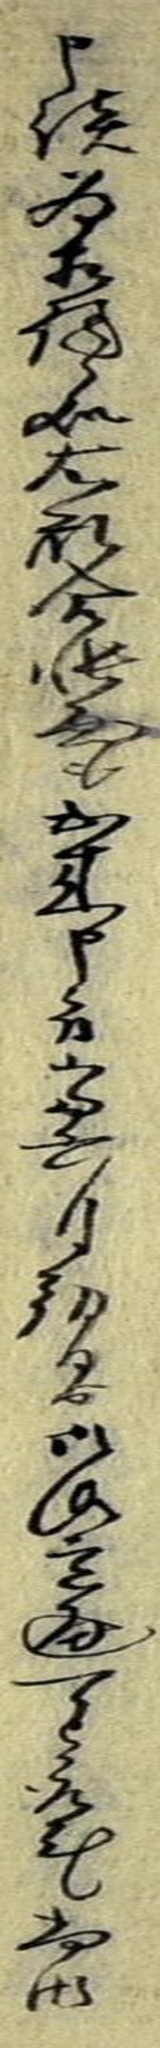申談為相伺候処右形合帳面も出来申ニ付当六月朔日ゟ御趣意通可被取計候尚御
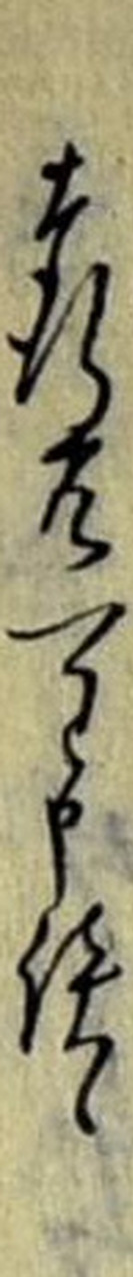奉行共可被申談候

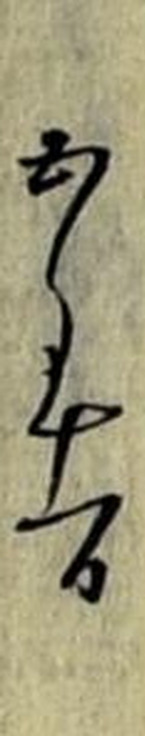五月十一日
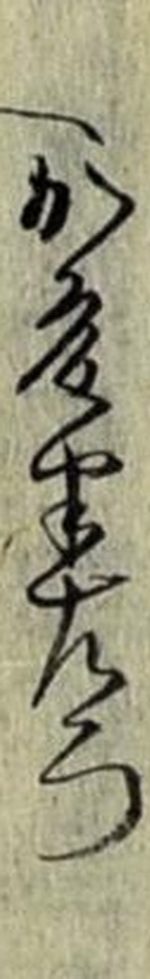加藤半左衛門
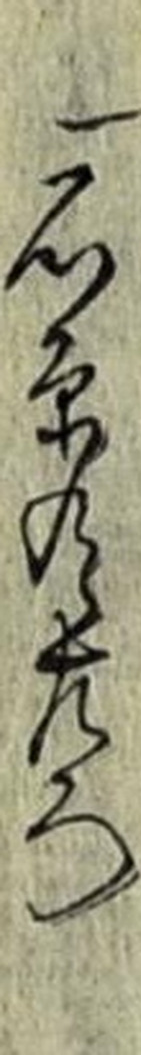石原九郎左衛門
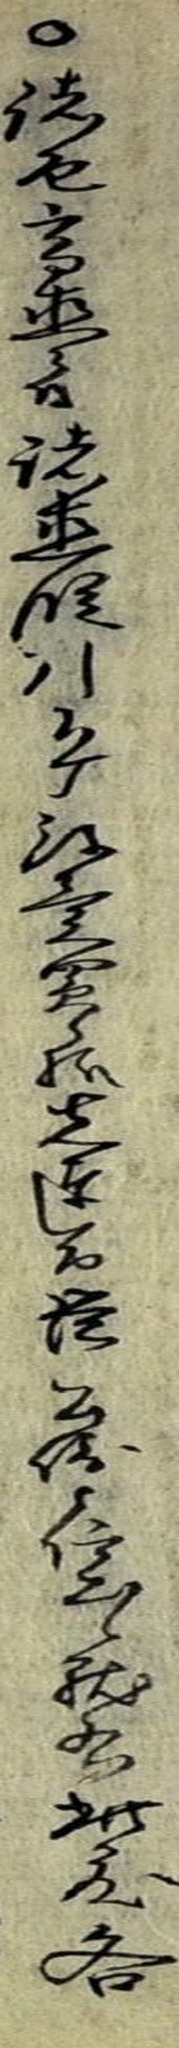〇諸色高直ニ付諸直段引下ケ致売買候様先達而従公儀被仰出候就右此度各
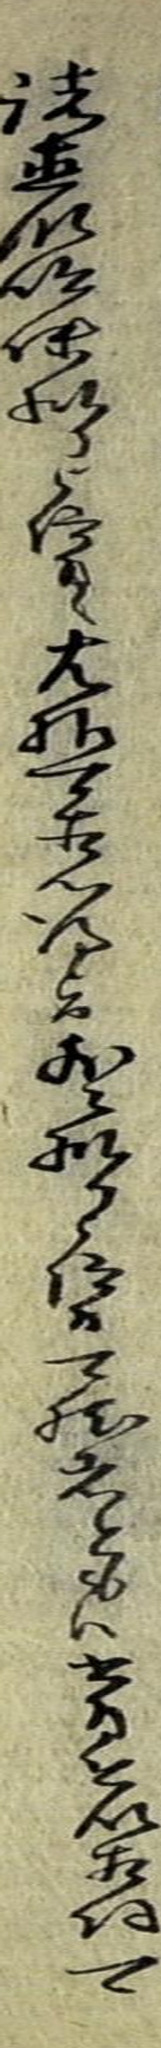諸直段吟味掛り被仰付候左様可相心得旨外ニ掛り被仰付可然者ともハ書付を以相伺可
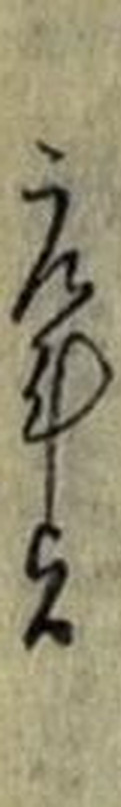取計旨
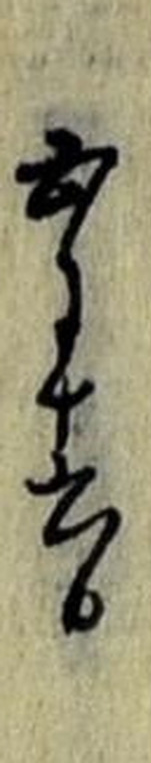五月十六日
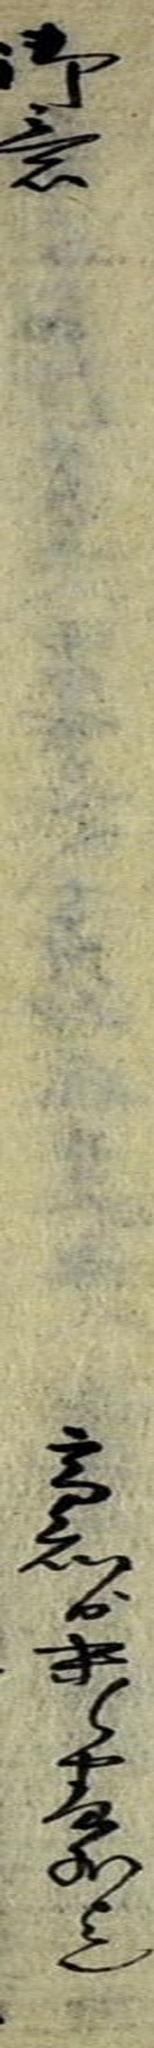御意高知ゟ末之番外迄
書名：命令之部 三
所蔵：福井県文書館 Fukui Prefectural Archives
